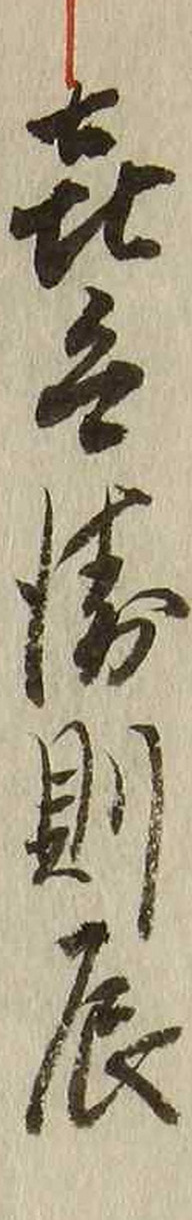喜兵衛則辰
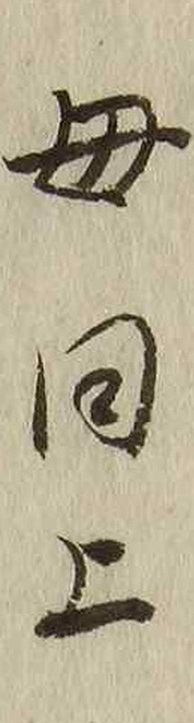母同上
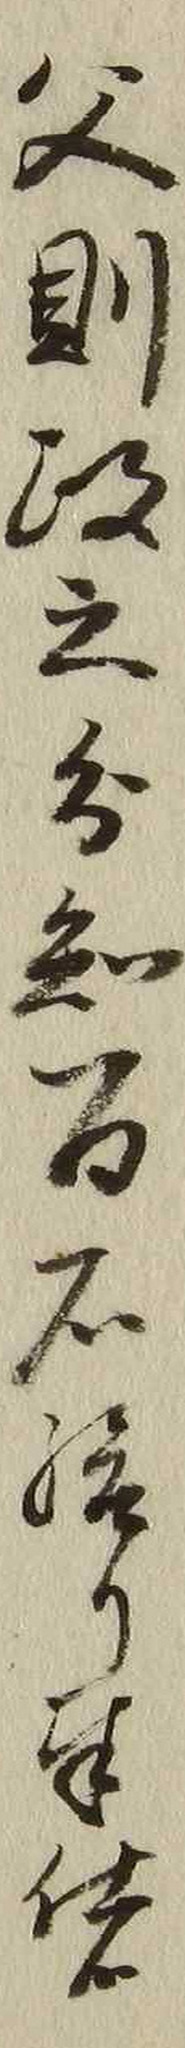父則政之分知百石給り奉仕候
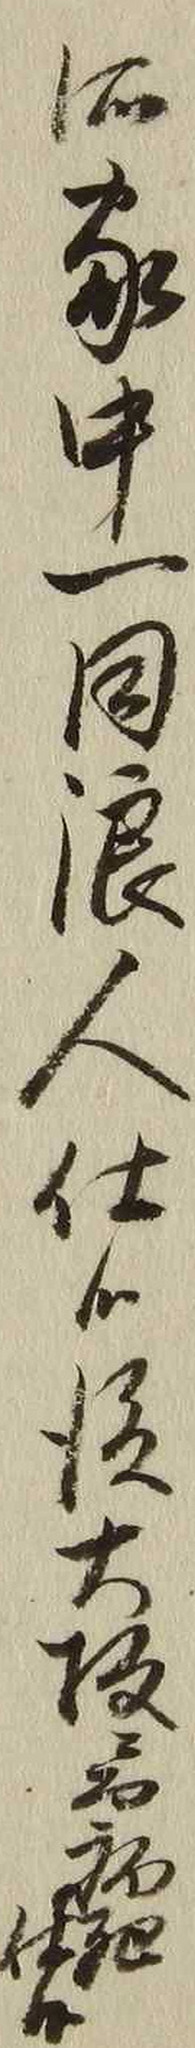所家中一同浪人仕候後大坂ニ而病死仕候
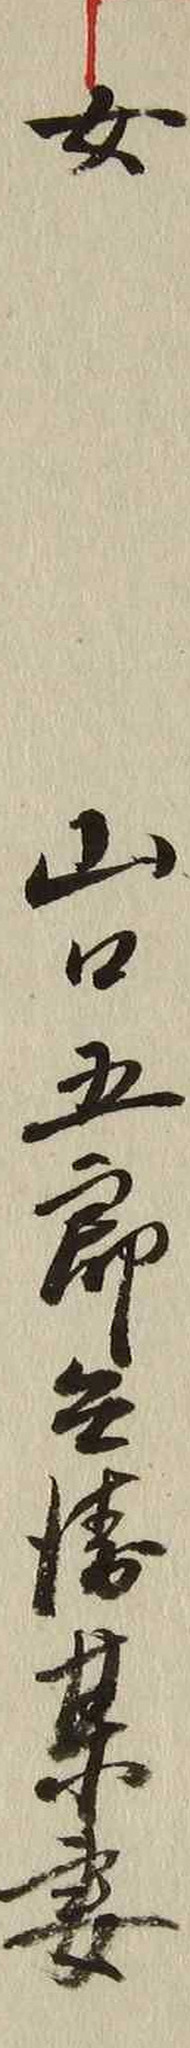女山口五郎兵衛某妻
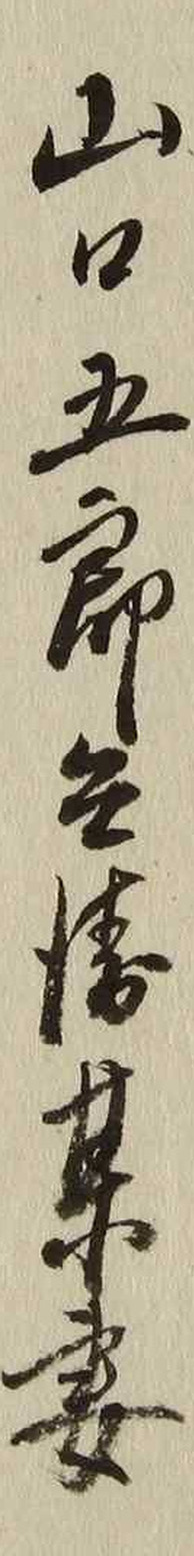女山口五郎兵衛某妻
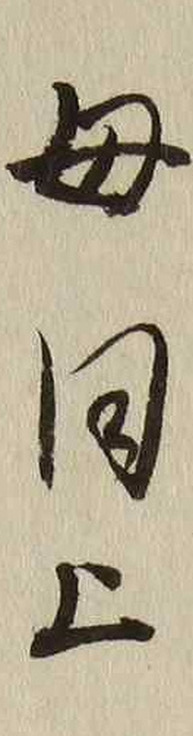母同上
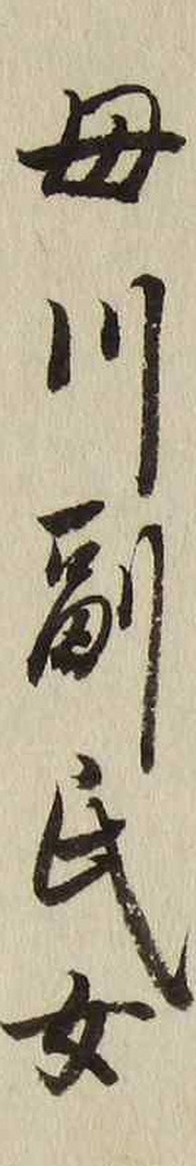母川副氏女

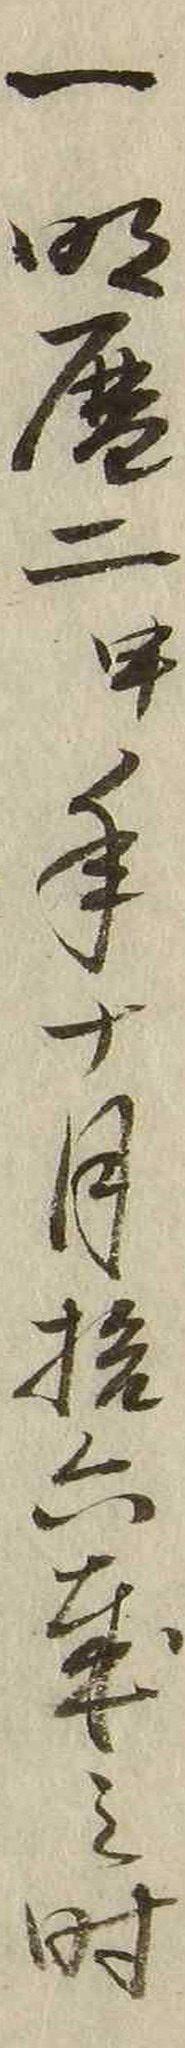一明暦二申年十月拾六歳之時
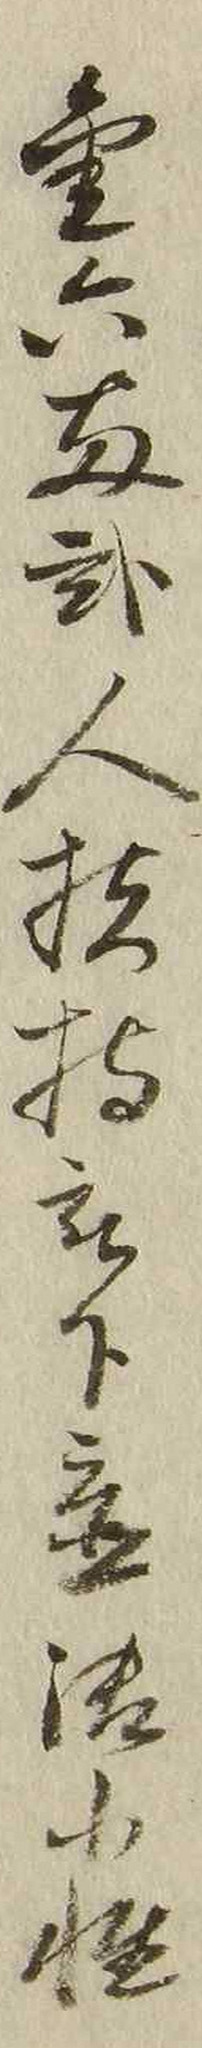金六両弐人扶持被下置御小性
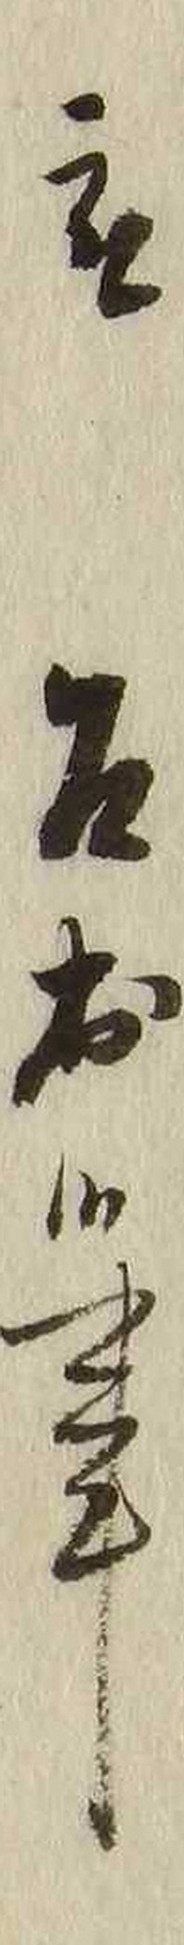被召出候事
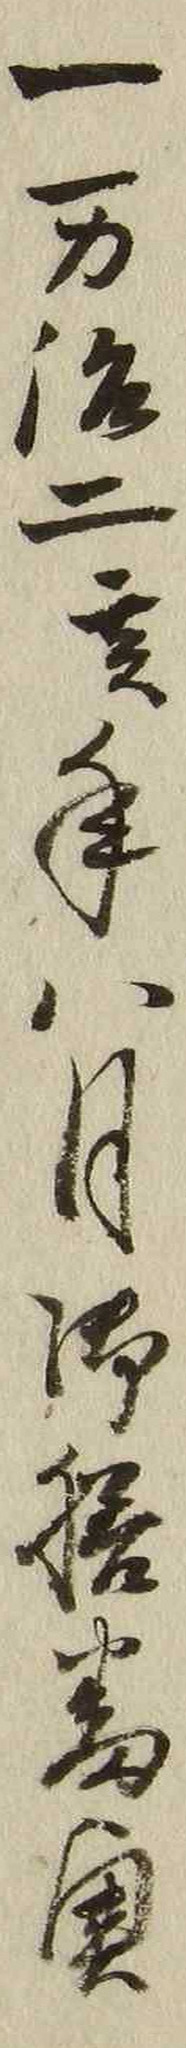一万治二亥年八月御膳番奥
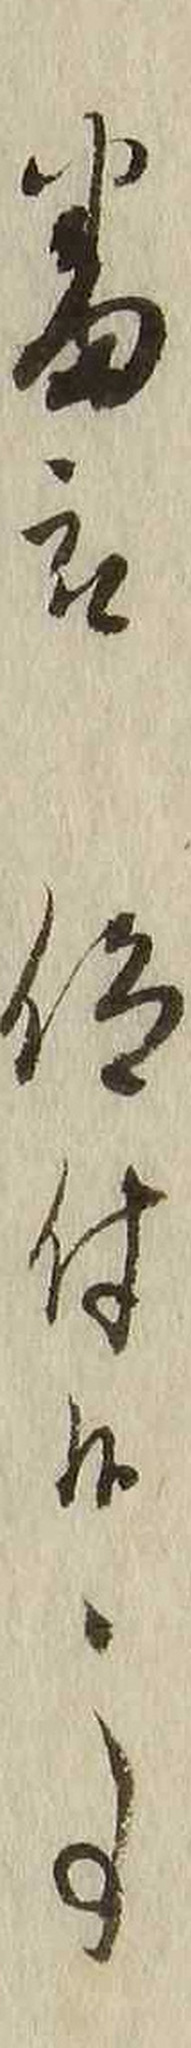番被仰付候事
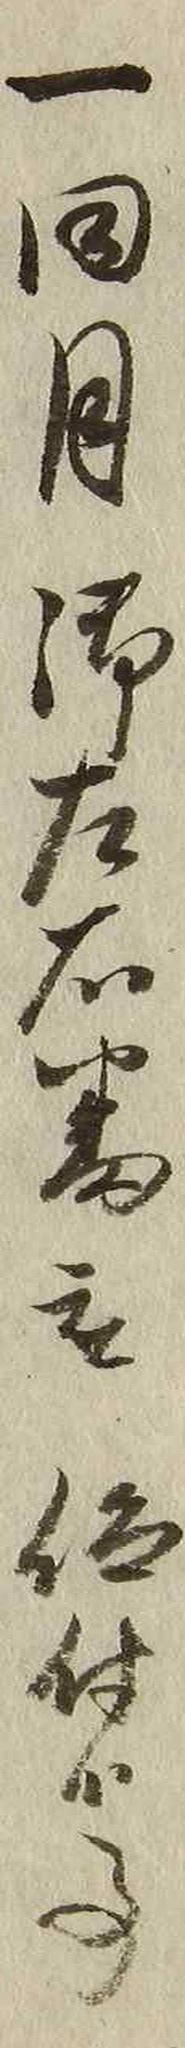一同月御左石番被仰付候事
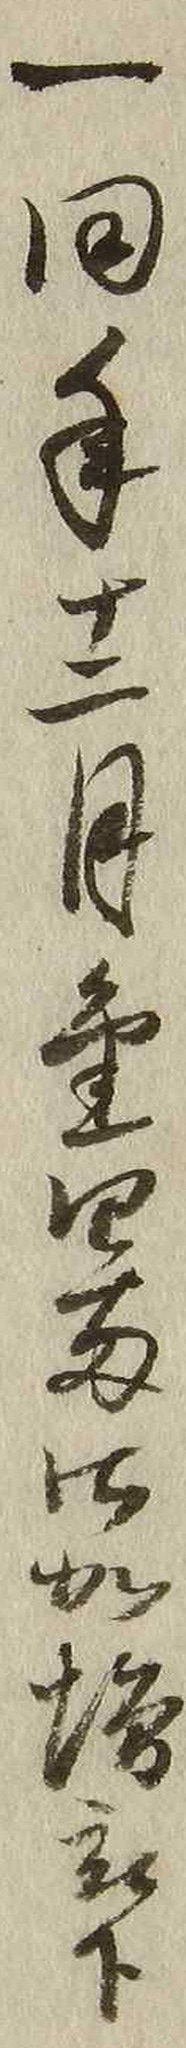一同年十二月金四両御加増被下
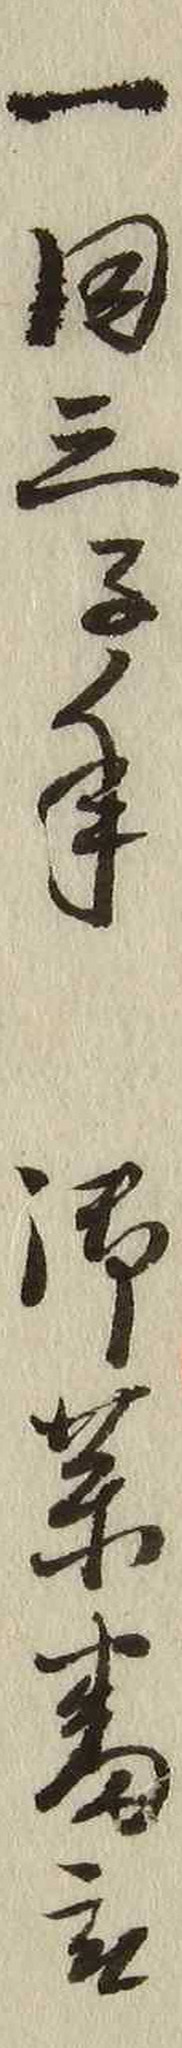一同三子年御薬番被
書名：諸士系譜　巻之355　す之部5
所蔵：会津若松市立会津図書館
